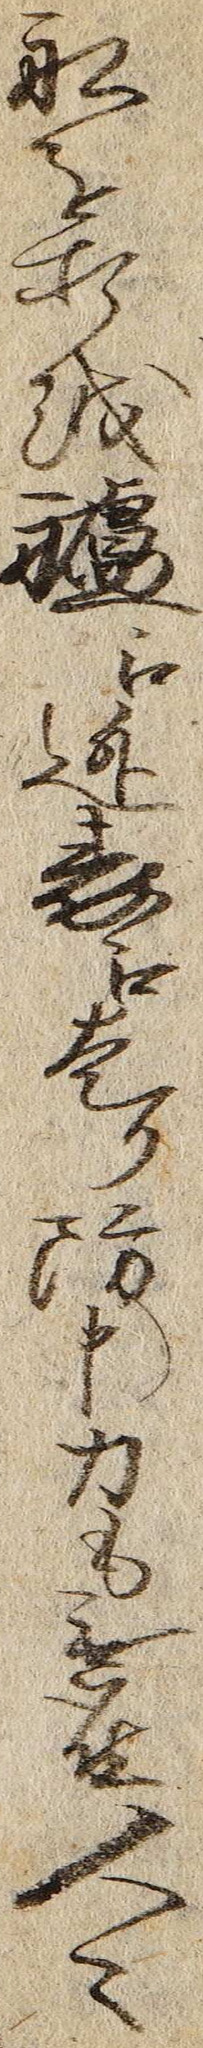船を打越艫へ逃表へ走り防申力も無御座人々
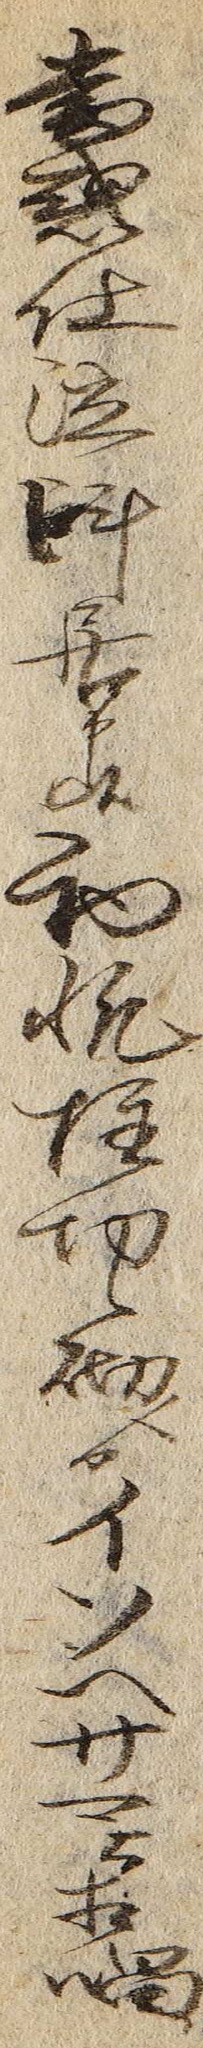当惑仕泣叫居申候初帆柱切候砌よりイソヘサマと相唱る
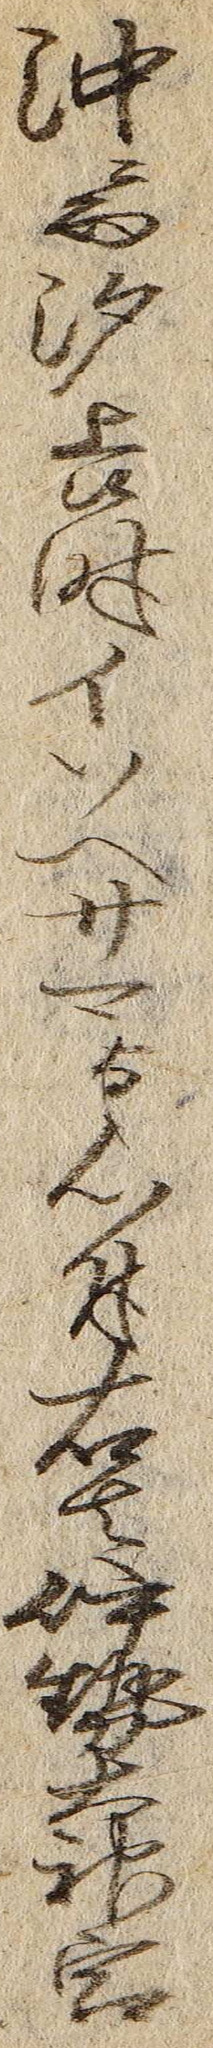沖にて汐上候時イソヘサマと心付右は伊勢大神宮
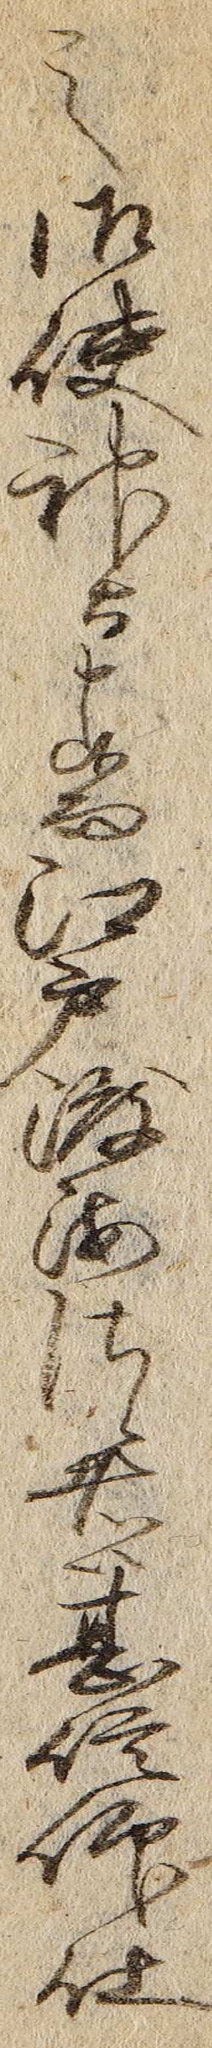の御使神と申候て江戸渡海仕候者は甚信仰仕
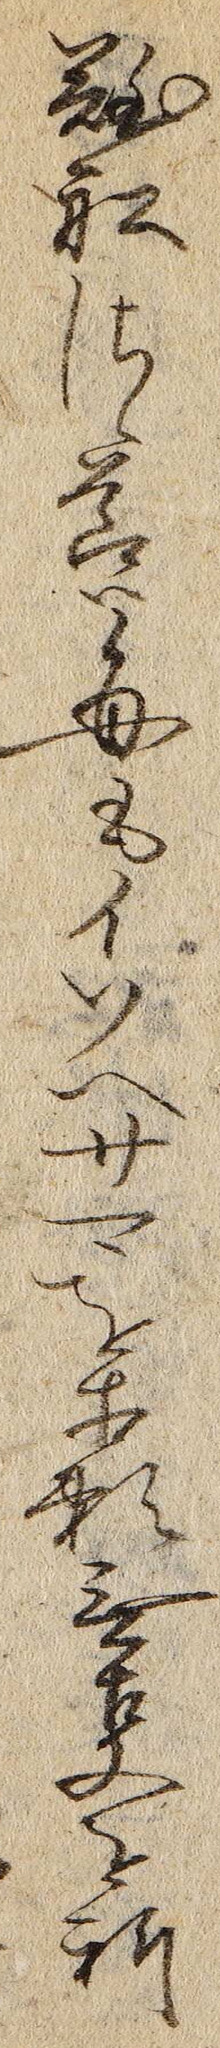難船仕候節は毎もイソヘサマを相頼無事を祈
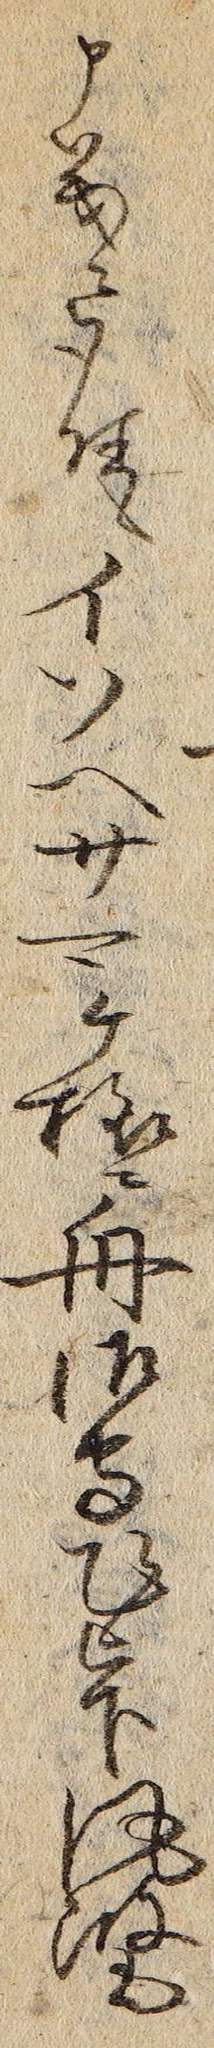申義に御座候イソヘサマケ様に舟御守乍被下風波も
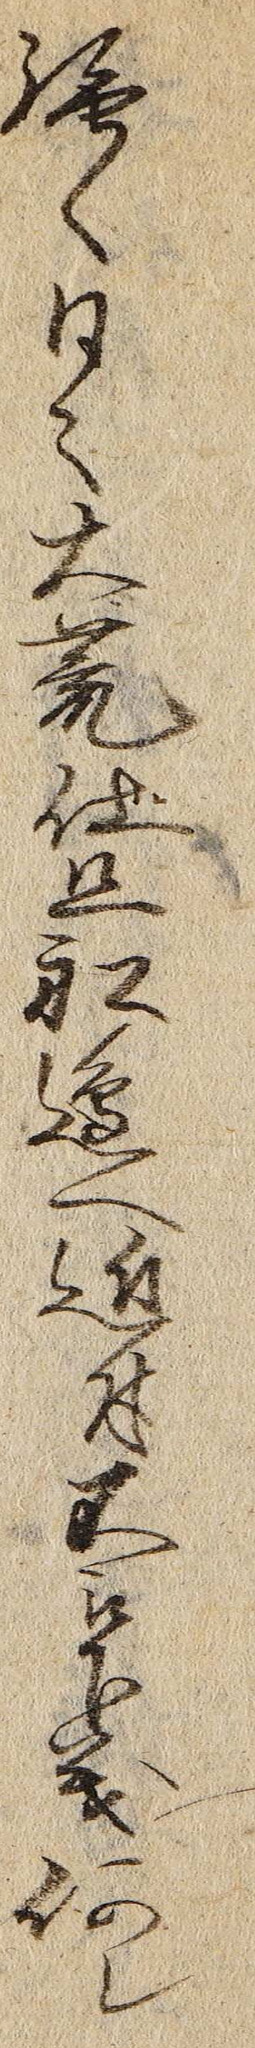強く日々大荒仕且船辺へ近付不被下義何レ
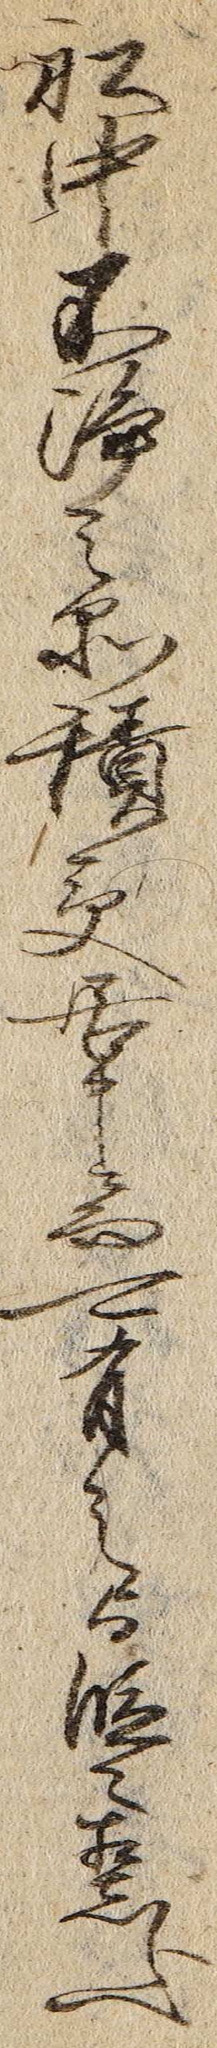船中不浄の品積受居申にて可有之と段々相しらへ
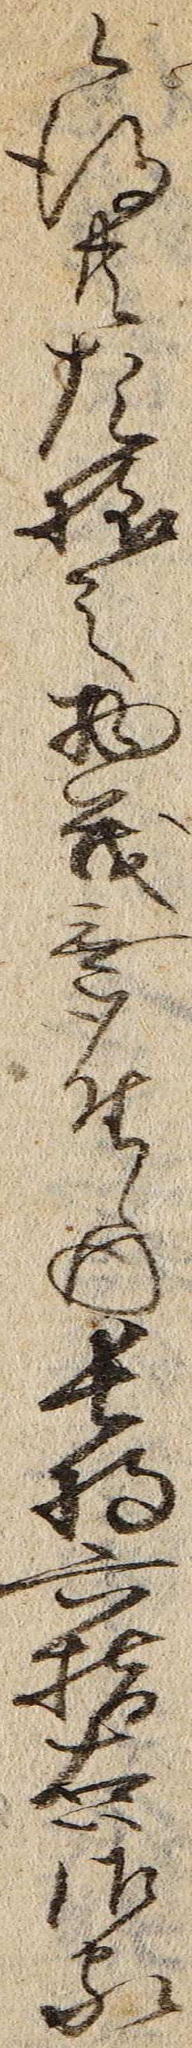候得ども左様の物も無御座候内長持六指右は御家
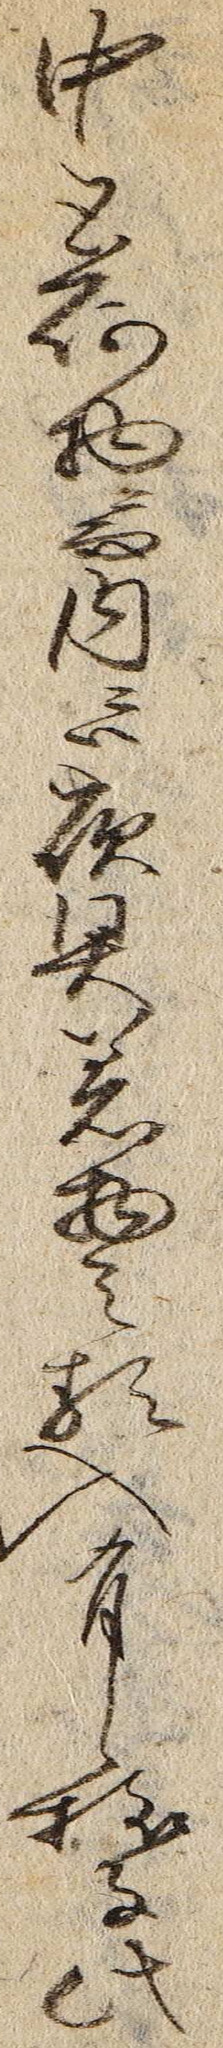中御荷物にて内には夜具着物の類入有之様子此
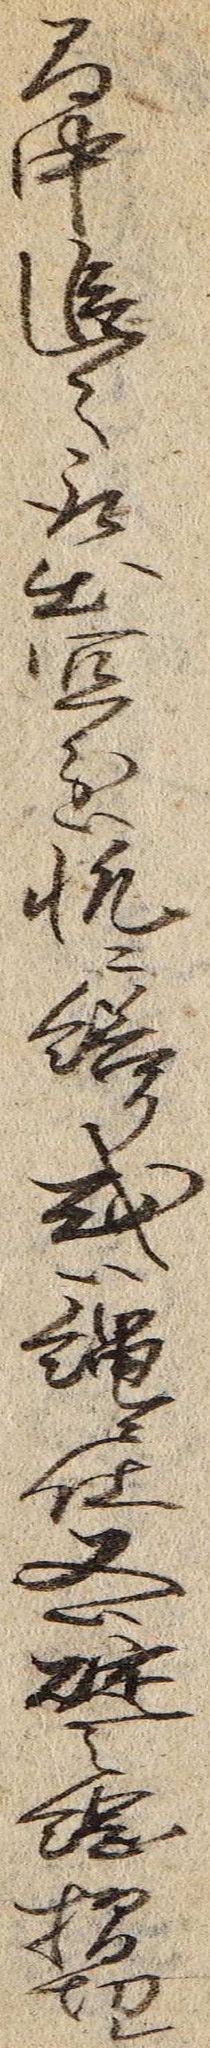間中追々取出宜分は帆に繕り或は縄に仕又は碇の綱摺切レ
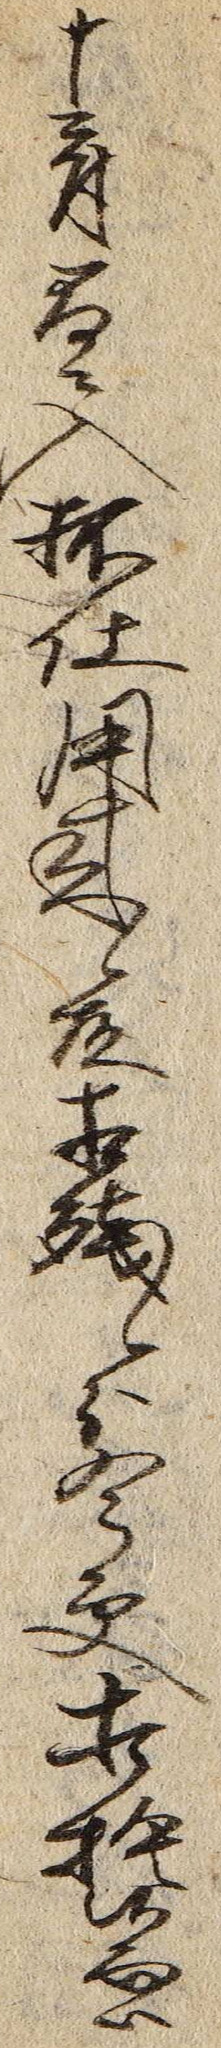申に付間に入抔仕用来候故相残候分今更打捨候ては
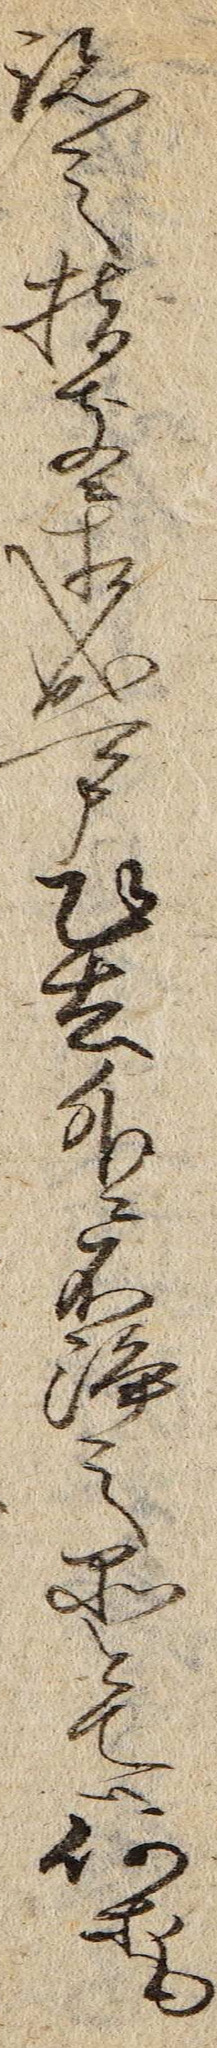跡の指支に相成可申乍去外に不浄の品とては何等も
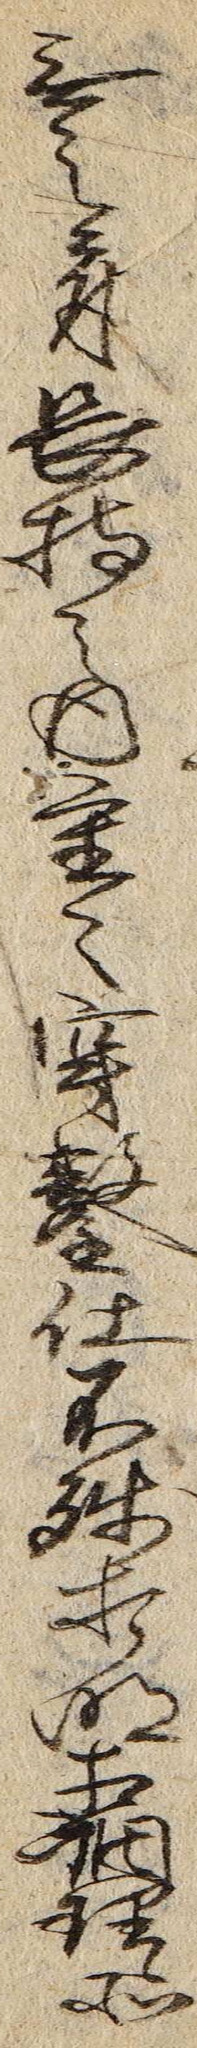無之に付長持の内重て穿鑿仕不残打明相調理候所
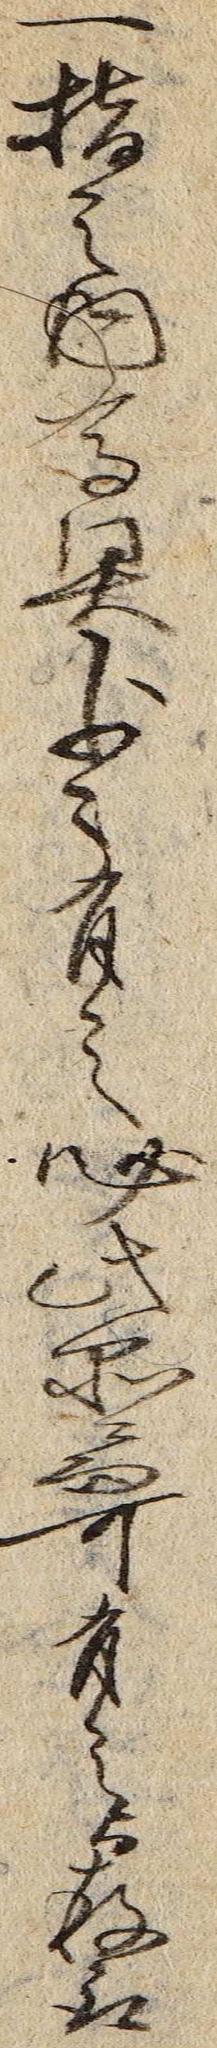一指の内馬具少々有之必此品にて可有之と存取
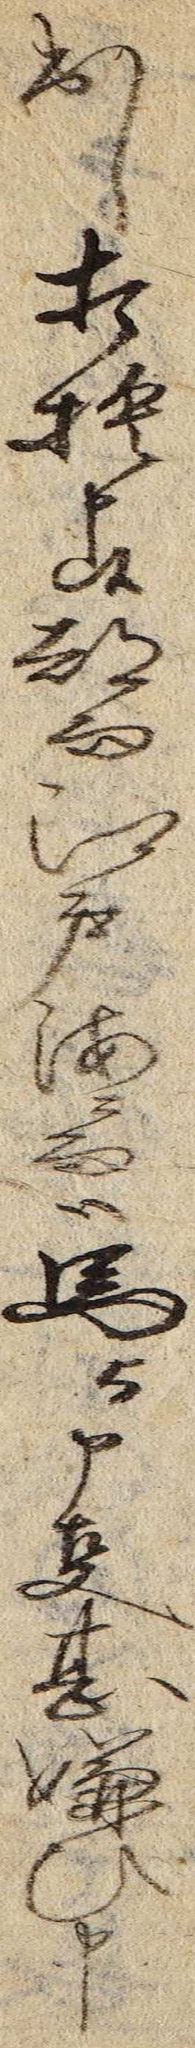出し打捨申候都て江戸海にては馬と申事甚嫌ひ申
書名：能登国清兵衛異国江漂流之始末
